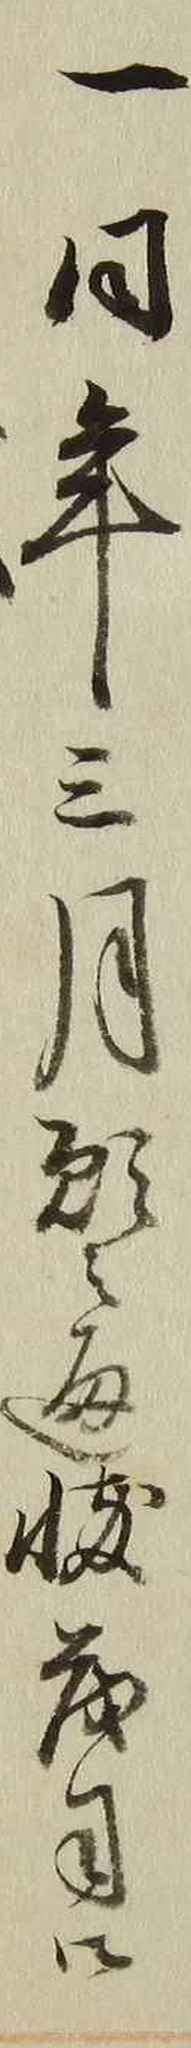一同年三月願之通忰茂司御
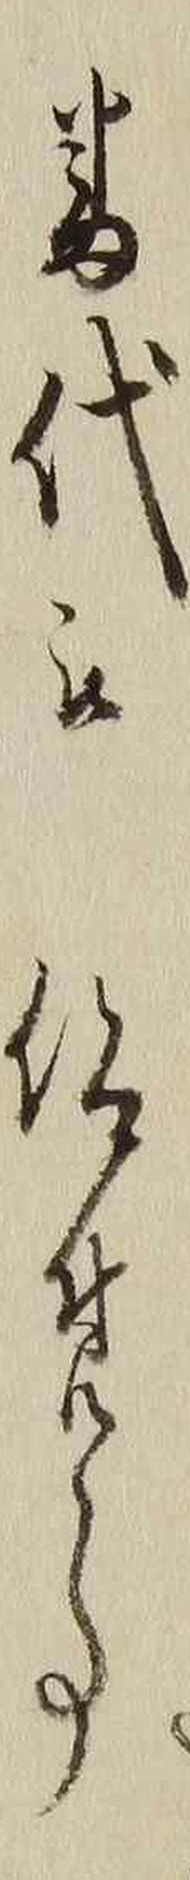番代被仰付候事
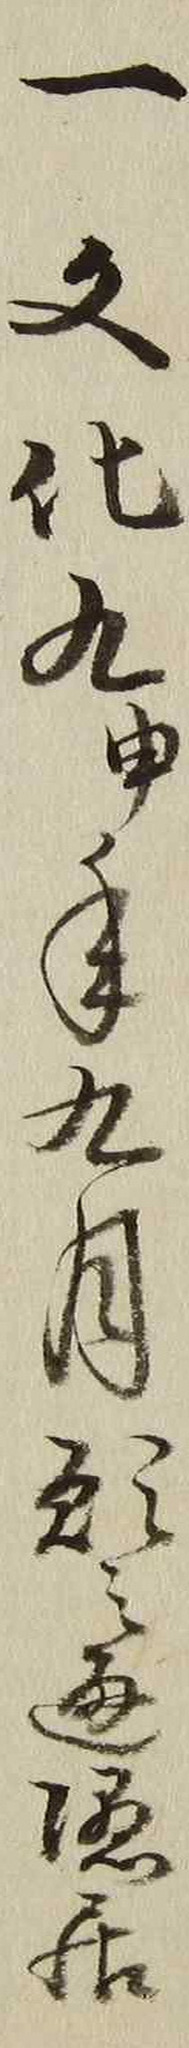一文化九申年九月願之通隠居
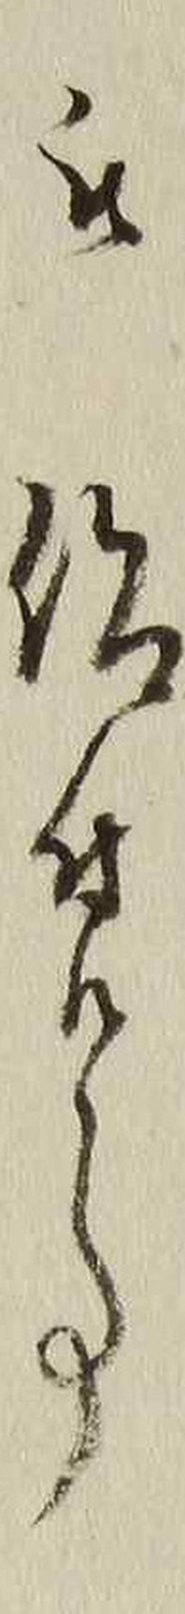被仰付候事
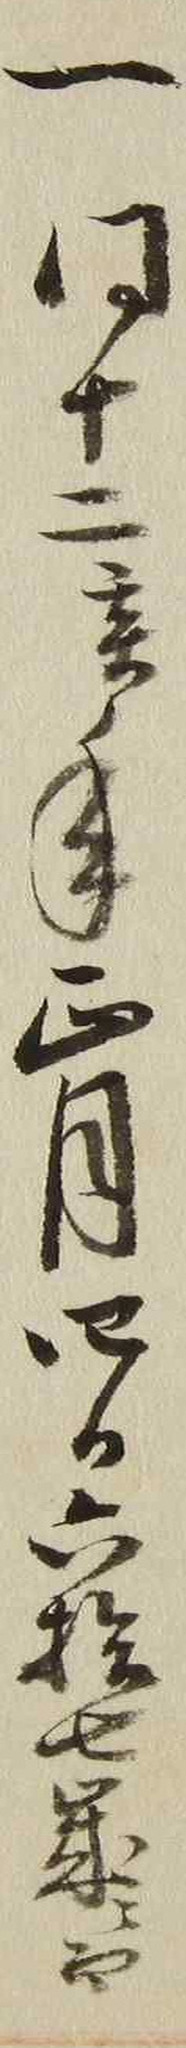一同十二亥年正月四日六拾七歳ニ而
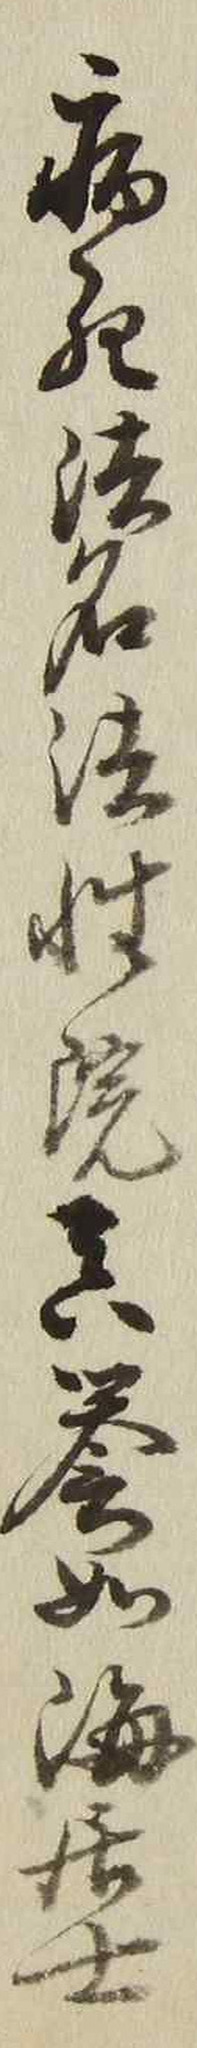病死法名法性院真誉如海居士
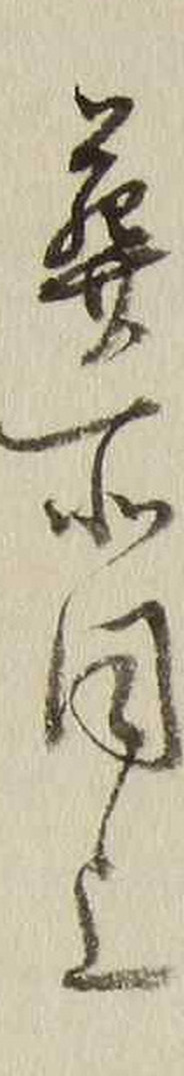葬所同上

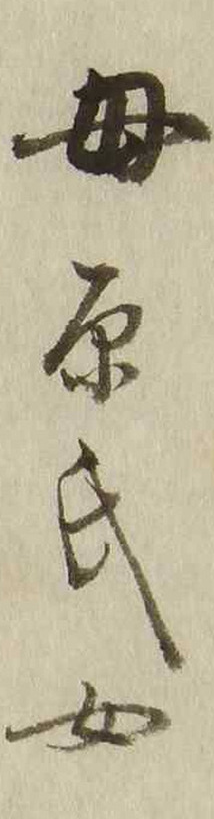母原氏女
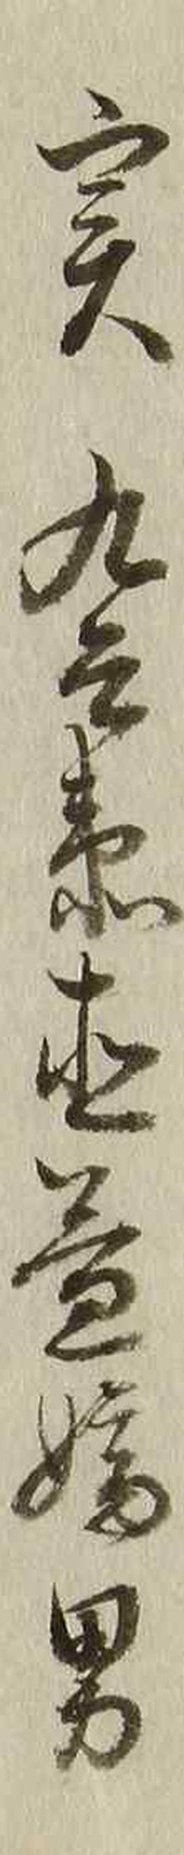実九兵衛直益嫡男
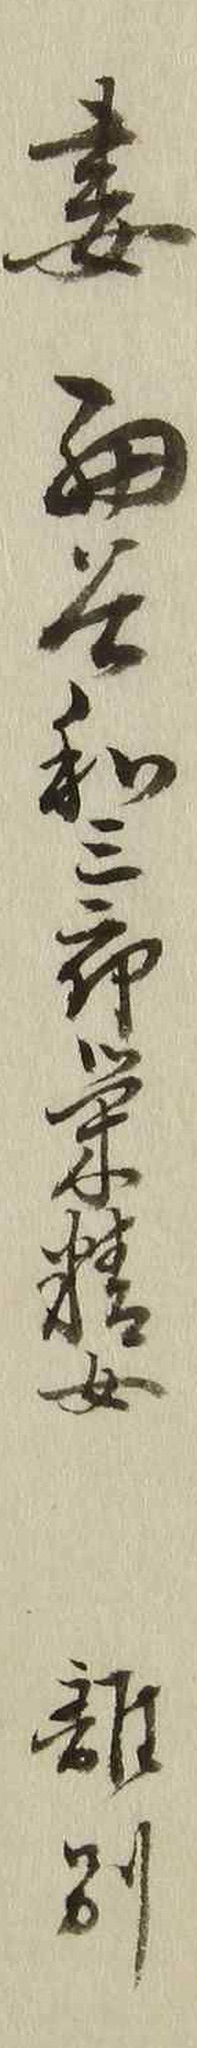妻細谷和三郎栄精女離別
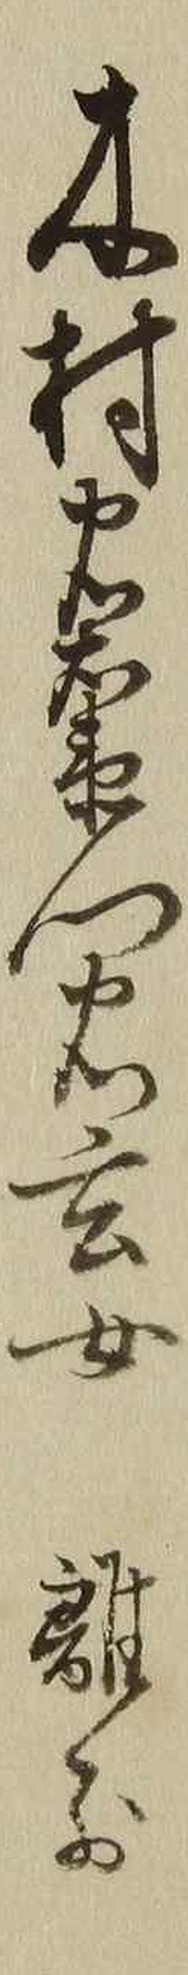木村忠右衛門忠玄女離別
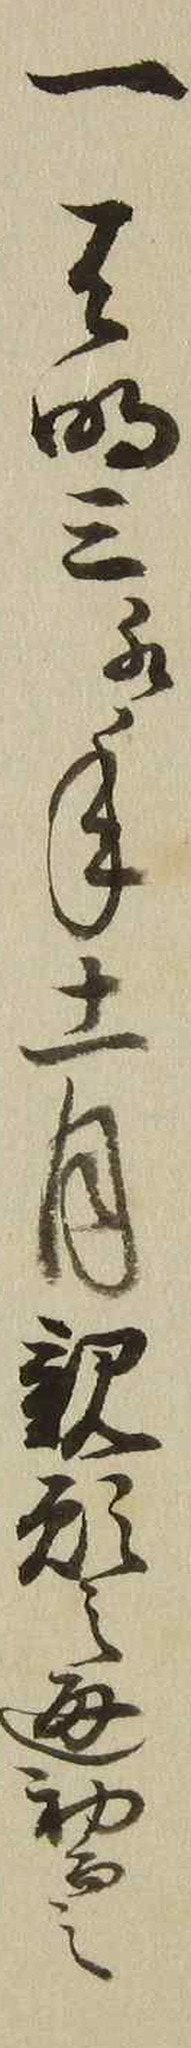一天明三卯年十一月親願之通初而之
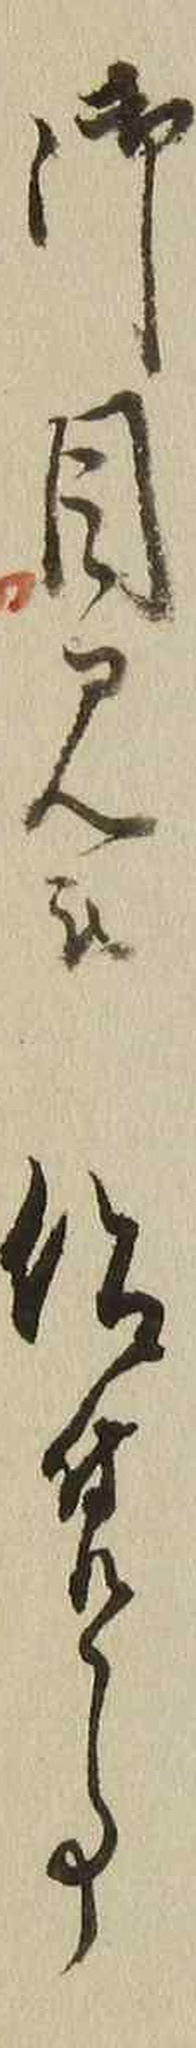御目見被仰付候事
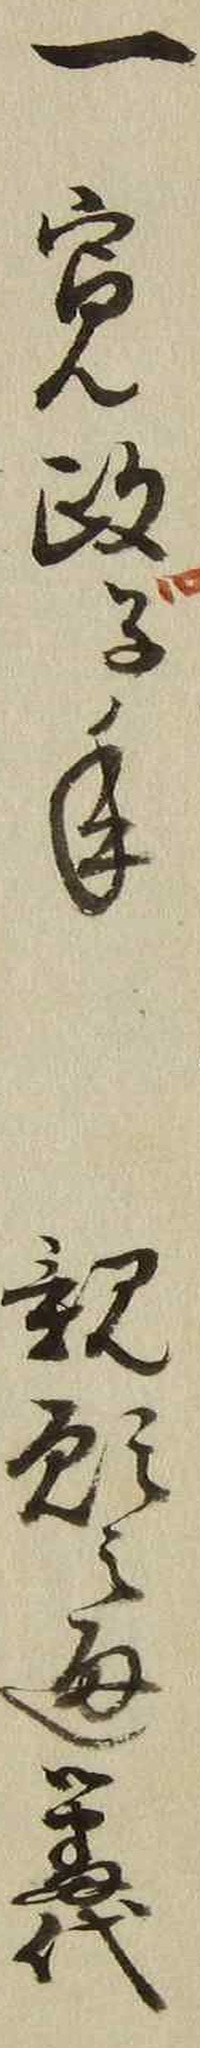一寛政四子年親願之通御番代
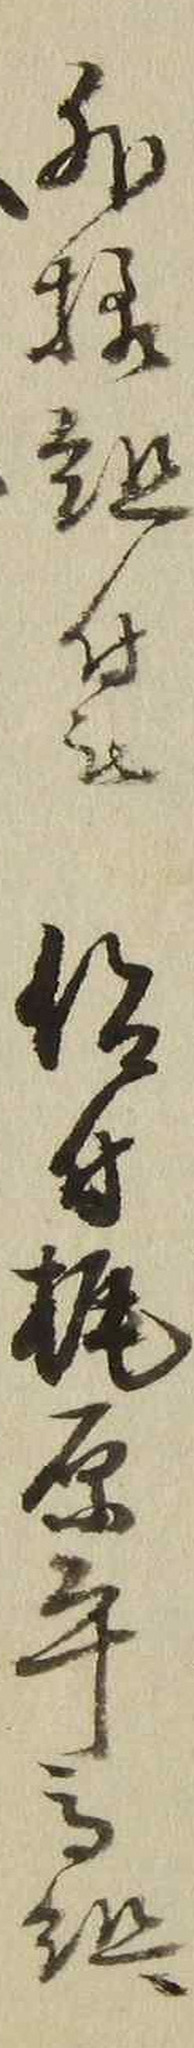外様組付被仰付梶原平馬組へ
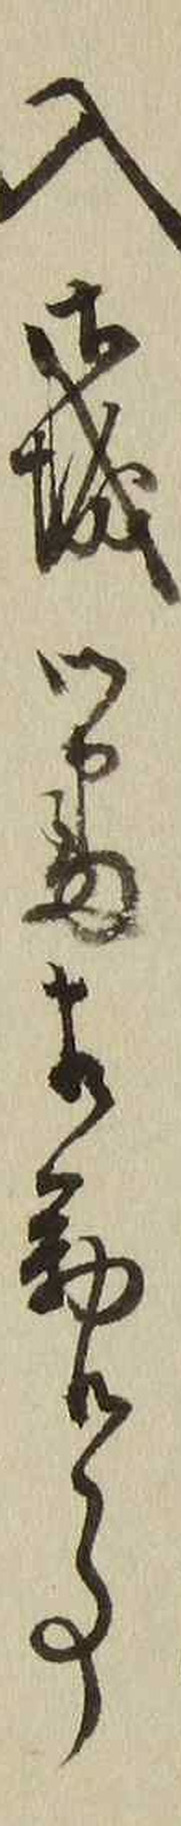入御城御番相勤候事
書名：諸士系譜　巻之53　に之部4
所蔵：会津若松市立会津図書館
